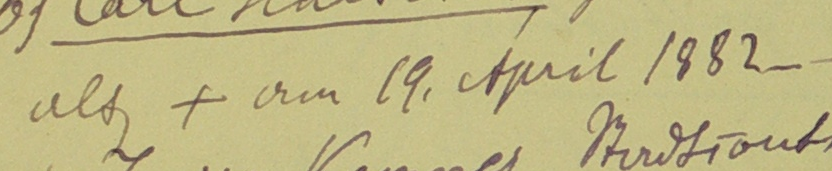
alt + am 19. April 82
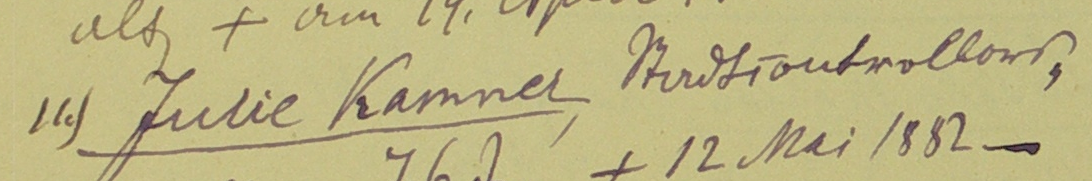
11,) Julie Kammer,Stadtcontrollers
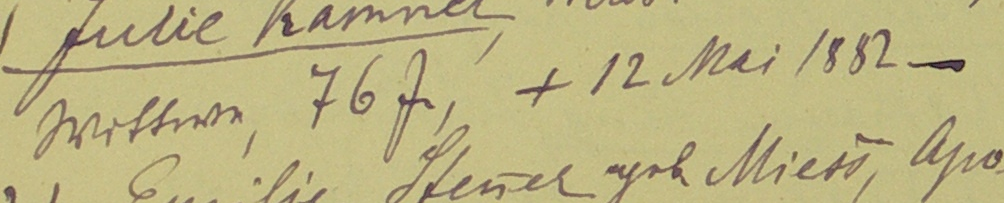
Witwe, 76 J. alt + am 12 Mai 82
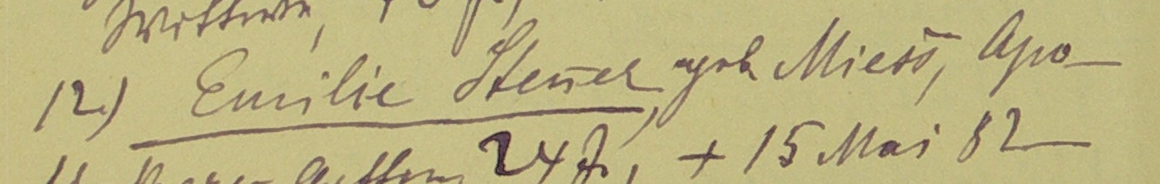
12.) Emilie Steuer, geb. Miess, Apo¬
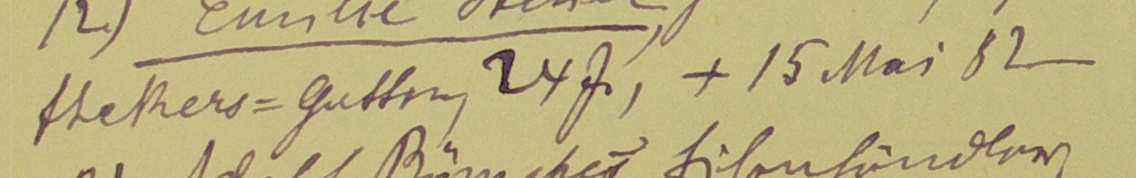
theker Gattin, 24 J.+ am 15 Mai 82
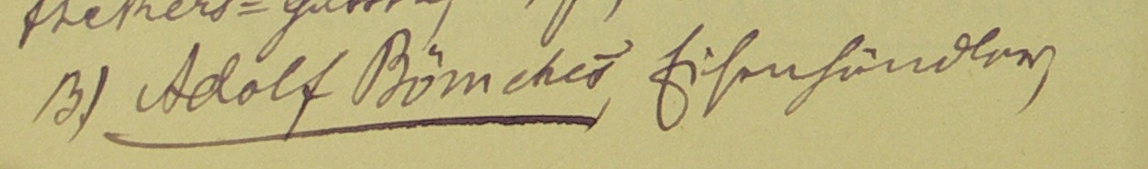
13.) Adolf Bömches, Eisenhändler .
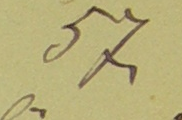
57
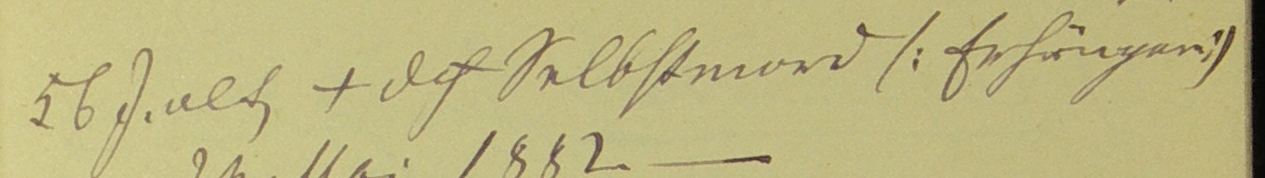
..56 J. alt , + durch Selbstmord (: Erhängen : )
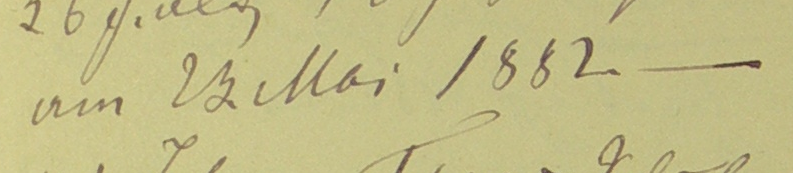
am 23 Mai 82
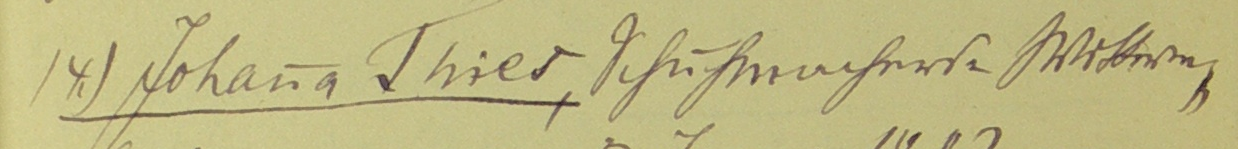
14.) Johanna Thier, Schuhmacher Witwe,
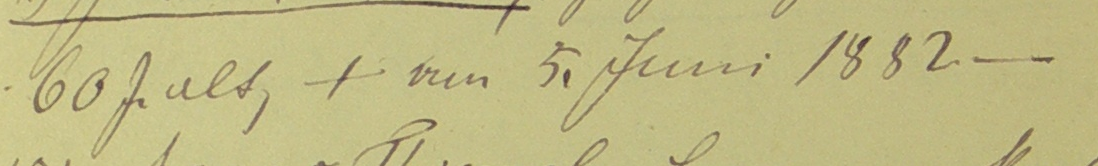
60 J. alt + am 5. Juni 82
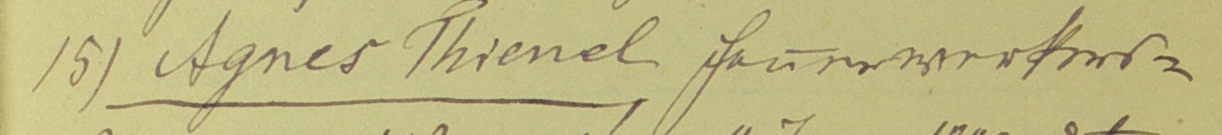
15.) Agnes Thienel, Feurwerkers
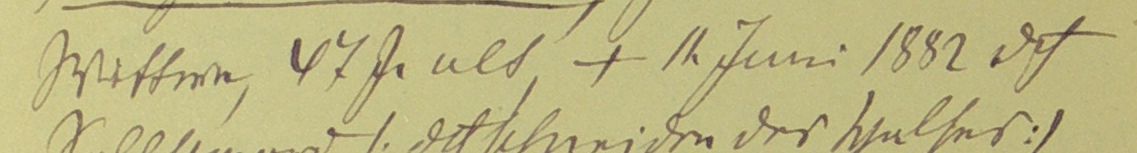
Witwe, 47 J. + am 14 Juni 82
